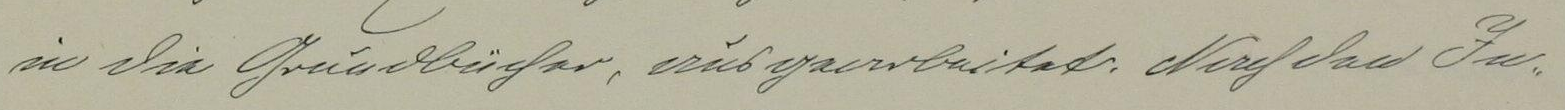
in die Grundbücher, ausgearbeitet. Nach den In-
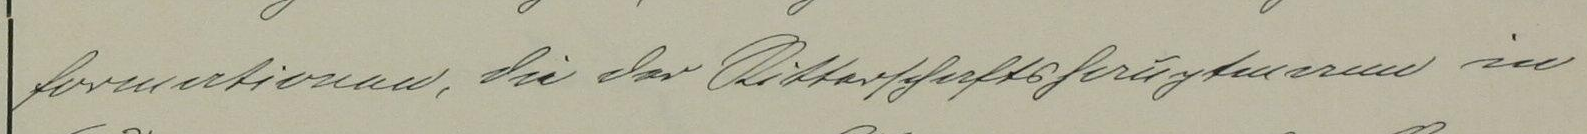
formationen, die der Ritterschaftshauptmann in
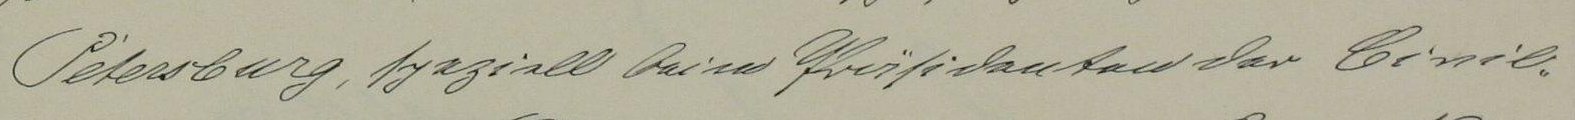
Petersburg, speziell beim Präsidenten der Civil-
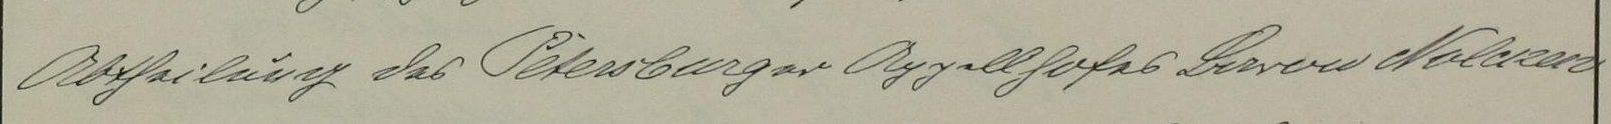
Abtheilung des Petersburger Appellhofes Baron Nolcken
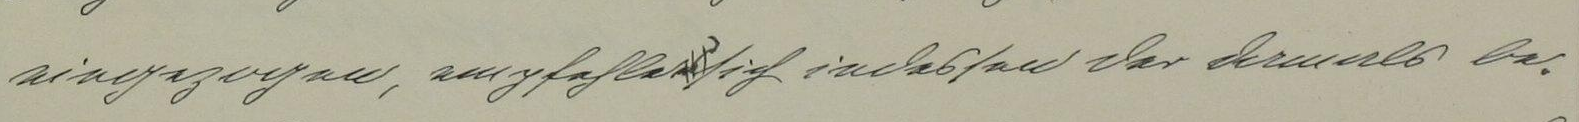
eingezogen, empfehlen sich indessen der damals be-
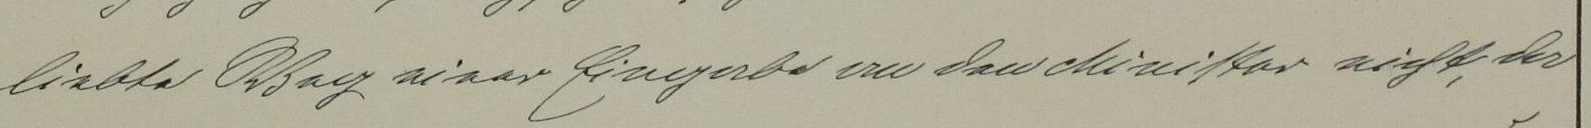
liebte Weg einer Eingabe an den Minister nicht, da
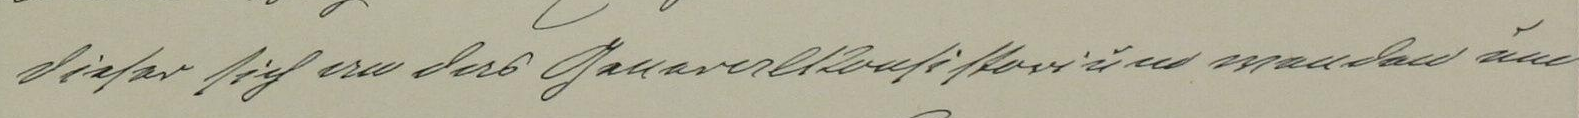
dieser sich an das Generalkonsistorium wenden und
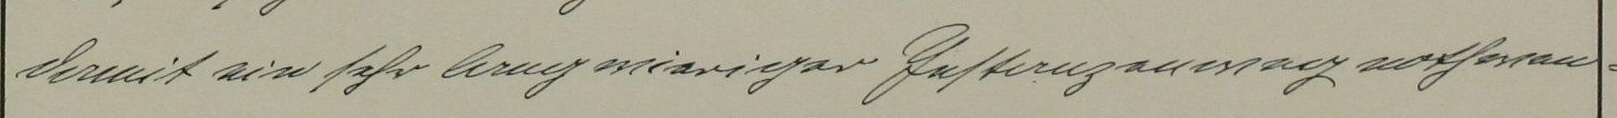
damit ein sehr langwieriger Instanzenweg nothwen-
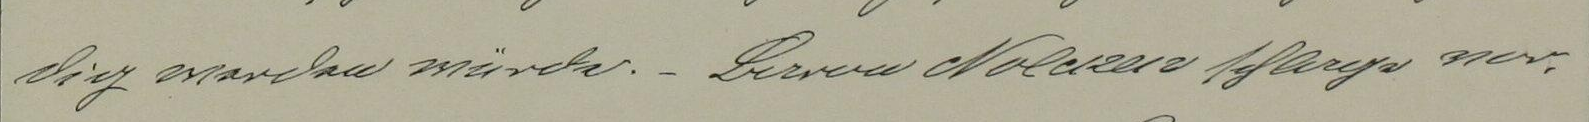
dig werden würde. – Baron Nolcken schlage vor,
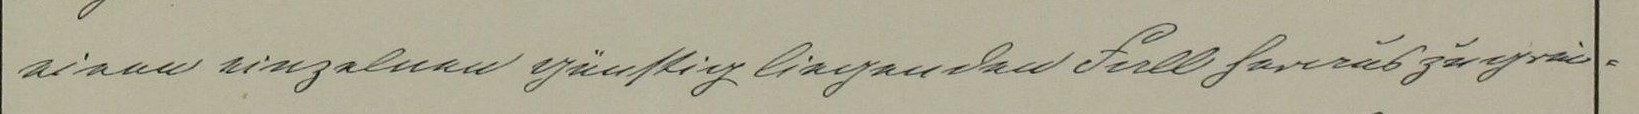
einen einzelnen günstig liegenden Fall herauszugrei-
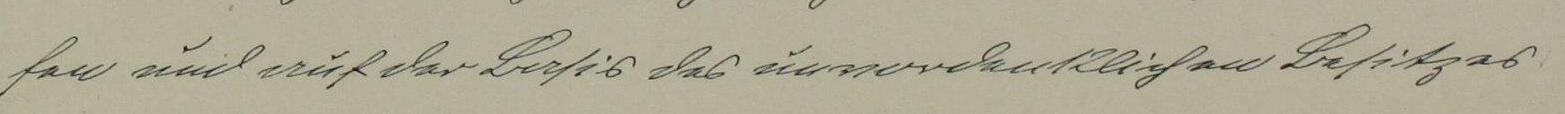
fen und auf der Basis des unvordenklichen Besitzes
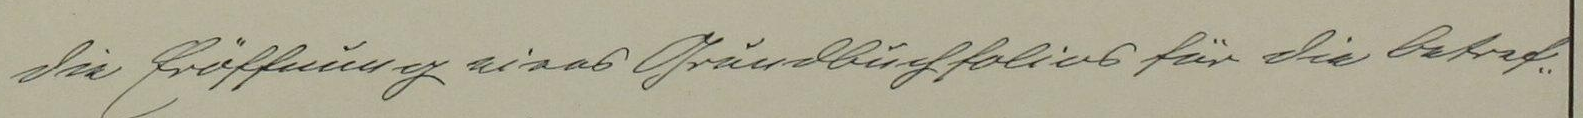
die Eröffnung eines Grundbuchfolios für die betref-
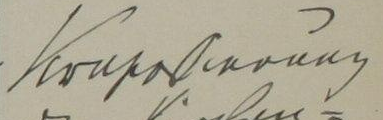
Krepostierung
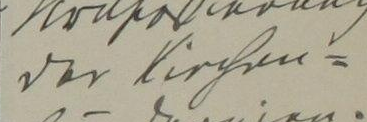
der Kirchen-
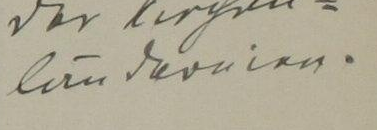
ländereien.
